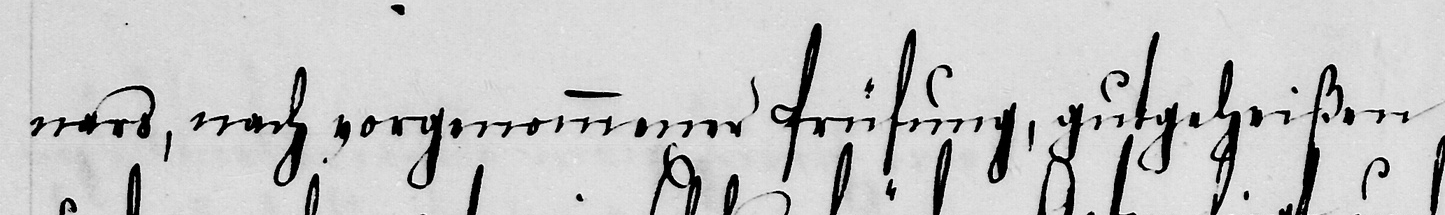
nars, nach vorgenommener Prüfung, gutgeheißen
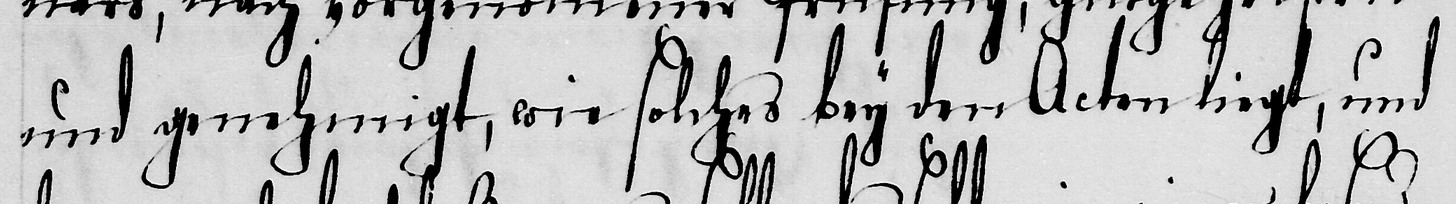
und genehmigt, wie solches bey den Acten liegt, und
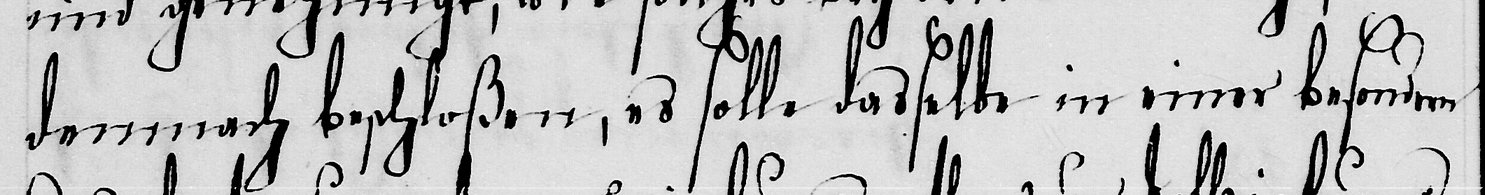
demnach beschloßen, es solle dasselbe in einer
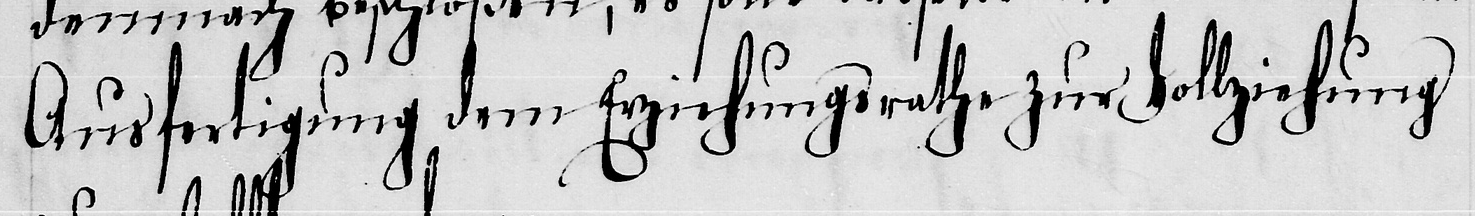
Ausfertigung dem Erziehungsrathe zur Vollziehung
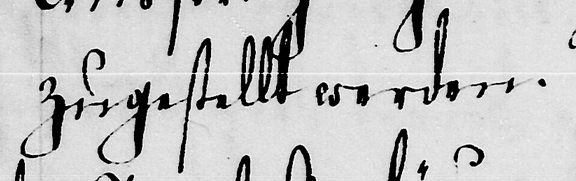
zugestellt werden.
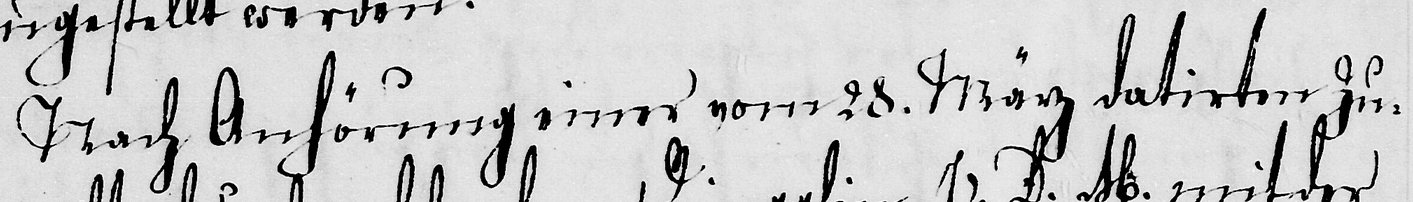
Nach Anhörung einer vom 28. März datirten Zus¬
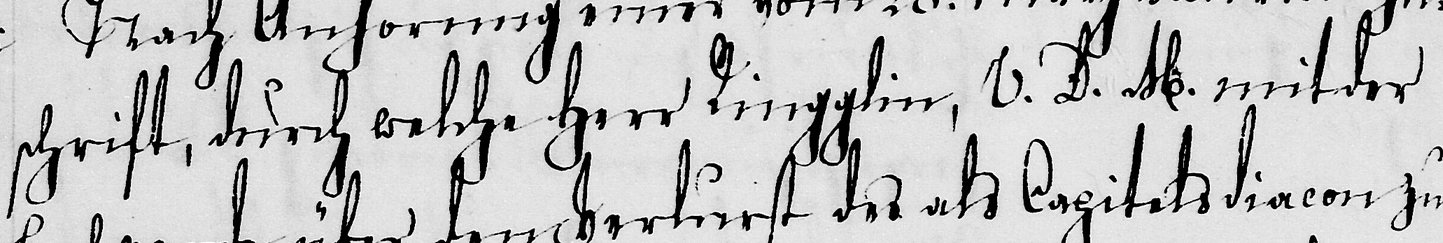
chrift, durch welche Herr Ringglin, V. D. M. mit der
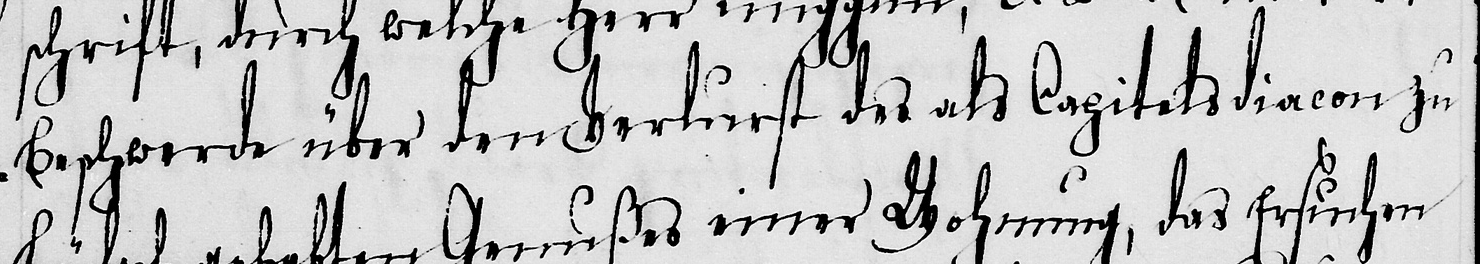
Beschwerde über den Verlust des als Capitalsdiacon zu
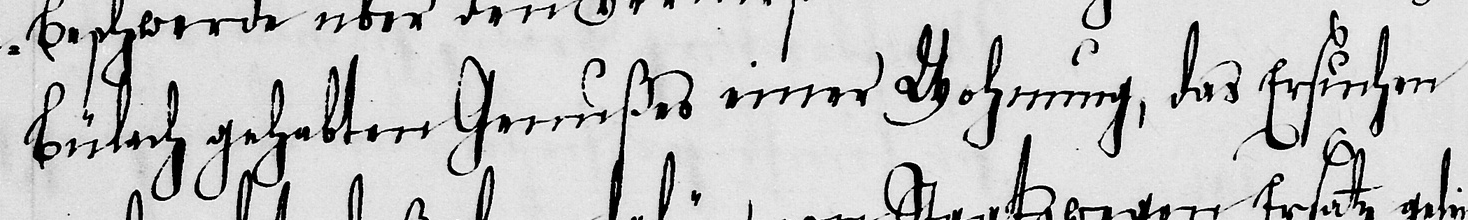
Bülach gehabten Genußes einer Wohnung, das Ersuchen
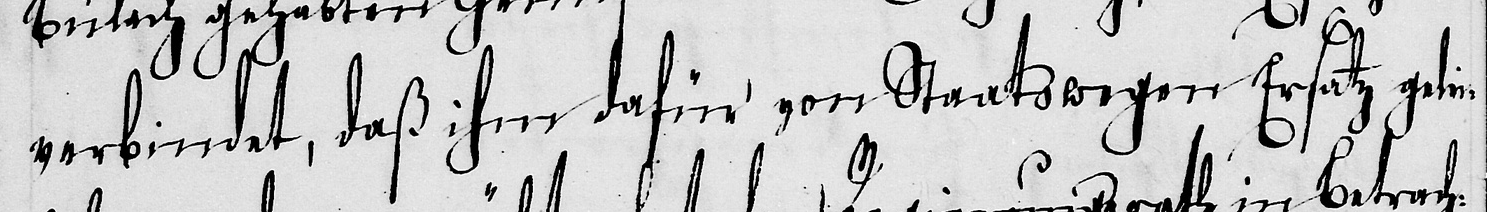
verbindet, daß ihm dafür von Staatswegen Ersatz gel¬
